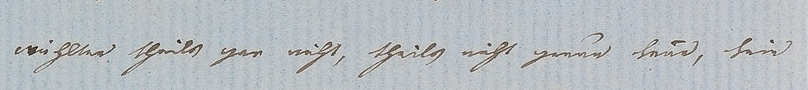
wählten theils gar nicht, theils nicht genau kenne, kein
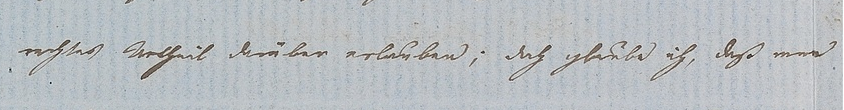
rechtes Urtheil darüber erlauben; doch glaube ich, daß man
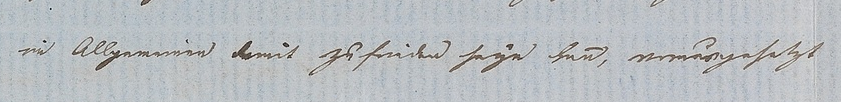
im Allgemeinen damit zufrieden seyn kann, vorausgesetzt
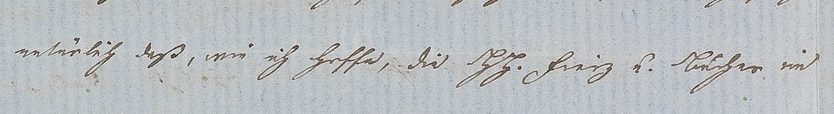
natürlich daß, wie ich hoffe, die HH. Fierz u. Bucher im
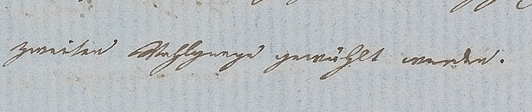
zweiten Wahlgange gewählt werden.
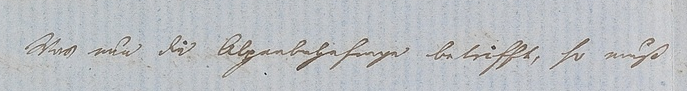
Was nun die Alpenbahnfrage betrifft, so muß
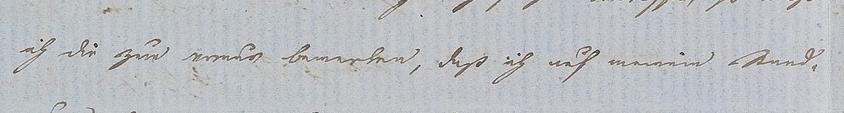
ich Dir zum voraus bemerken, daß ich auf meinem Stand-
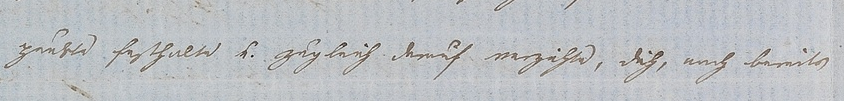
punkte festhalte u. zugleich darauf verzichte, Dich, nach bereits
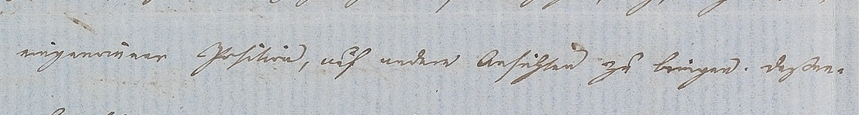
eingenommner Position, auf andere Ansichten zu bringen. Deßen
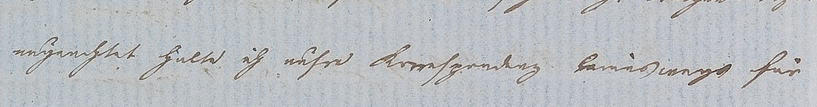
ungeachtet halte ich unsre Korrespondenz keineswegs für
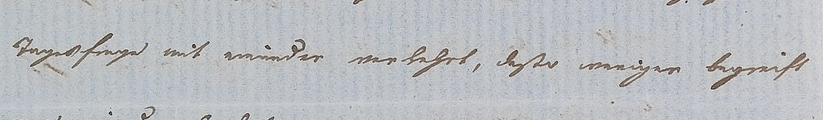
Tagesfrage mit einander verkehrt, desto weniger begreift
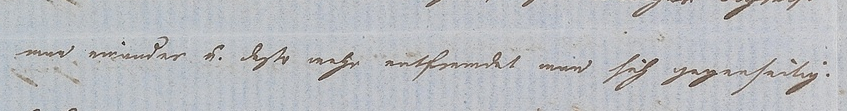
man einander u. desto mehr entfremdet man sich gegenseitig.
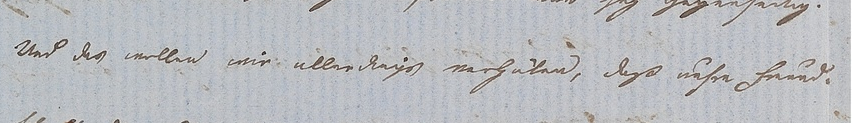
Und das wollen wir allerdings verhüten, daß unsre Freund-
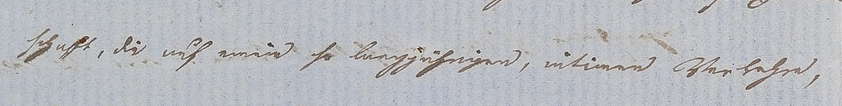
schaft, die auf einem so langjährigen, intimen Verkehr,
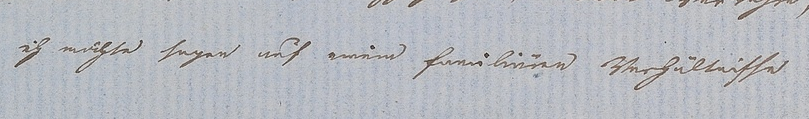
ich möchte sagen auf einem familiären Verhältnisse
